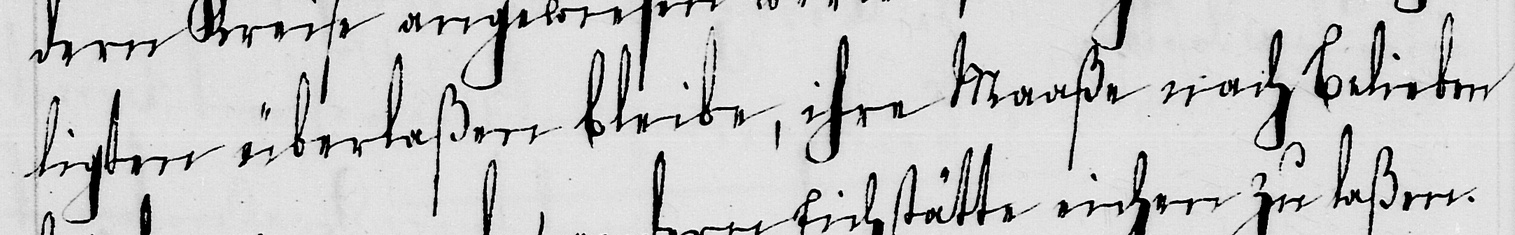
ligten überlaßen bleibe, ihre Maaße nach Belieben
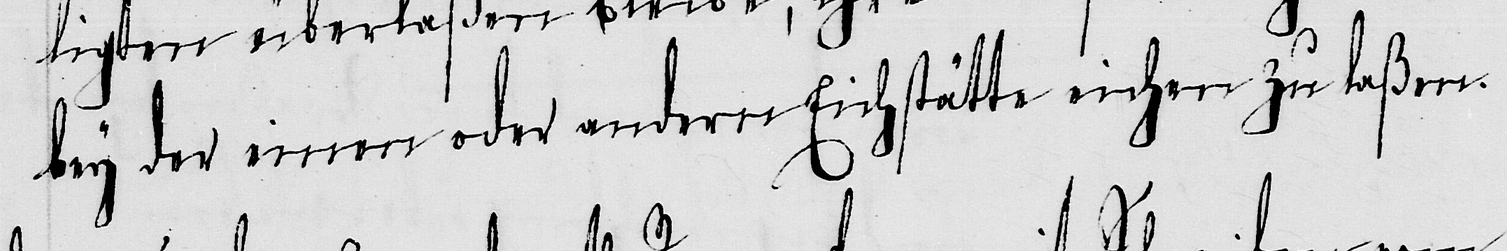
bey der einen oder andern Eichstätte eichen zu laßen.
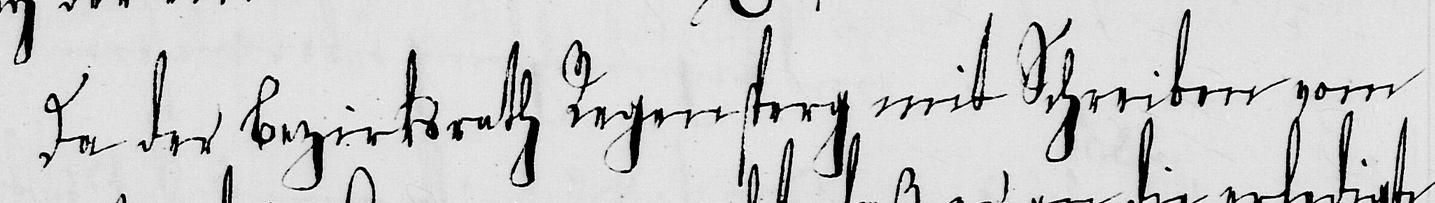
Da der Bezirksrath Regensberg mit Schreiben vom
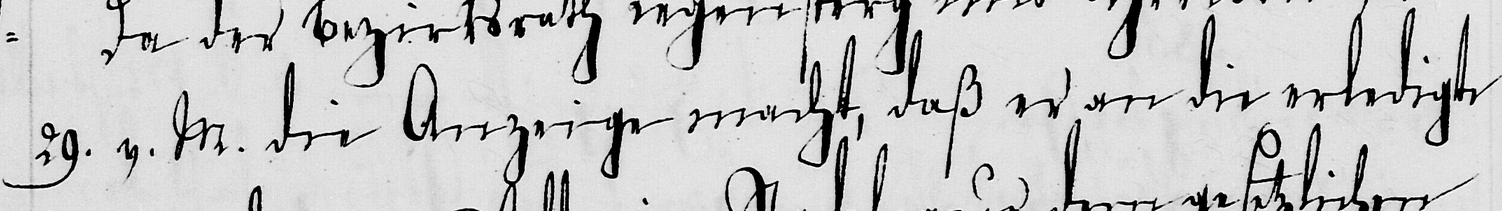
29. v. M. die Anzeige macht, daß er an die erledigte
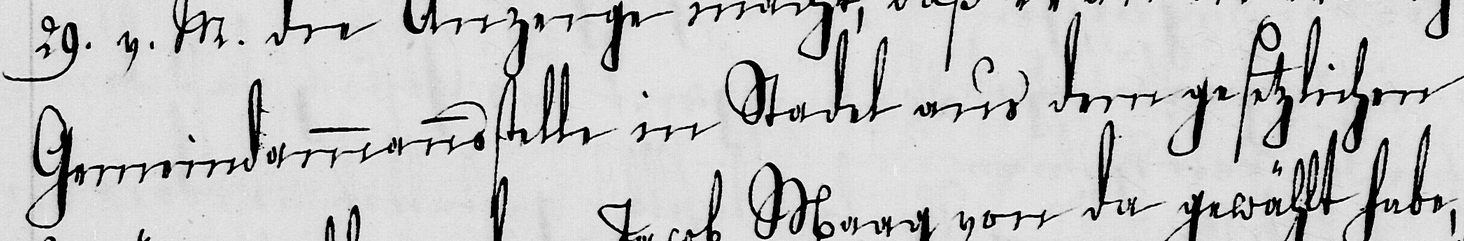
Gemeindammannstelle in Stadel aus dem gesetzlichen
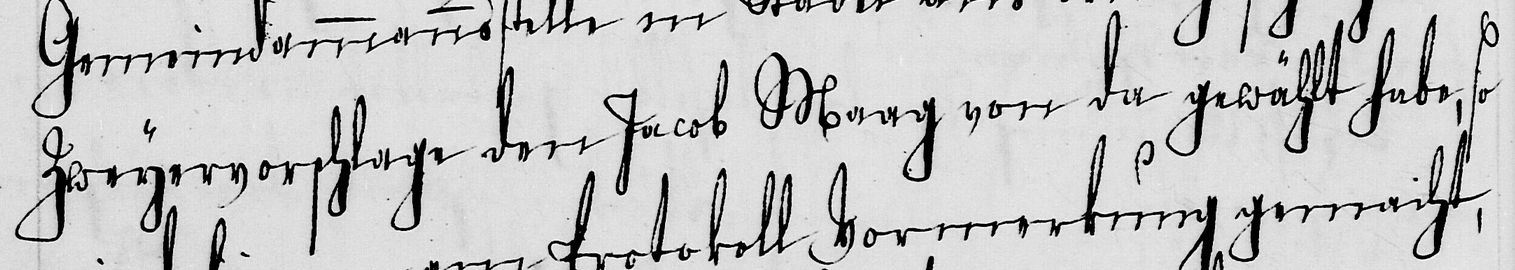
Zweyervorschlage den Jacob Maag von da gewählt habe,
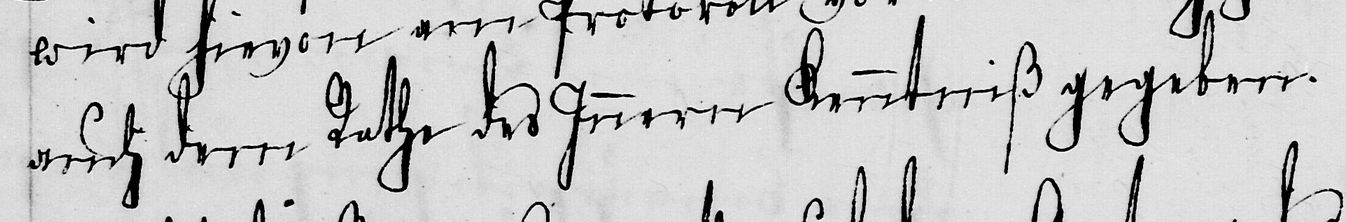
auch dem Rathe des Innern Kenntniß gegeben.
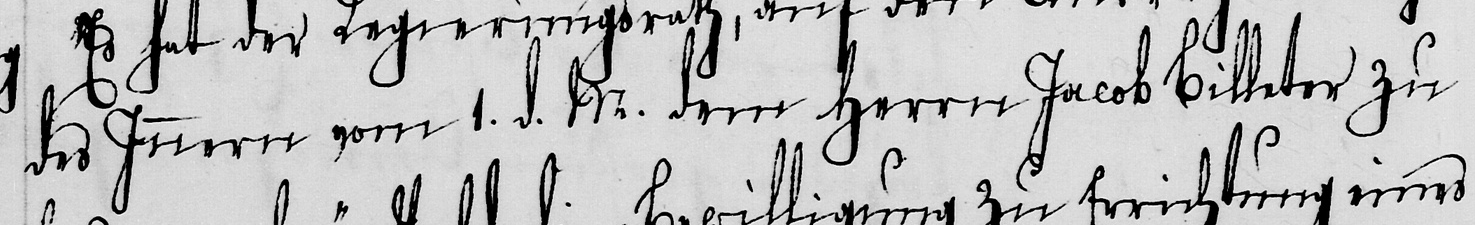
des Innern vom vom 1. d. M. dem Herrn Jacob Billeter zu
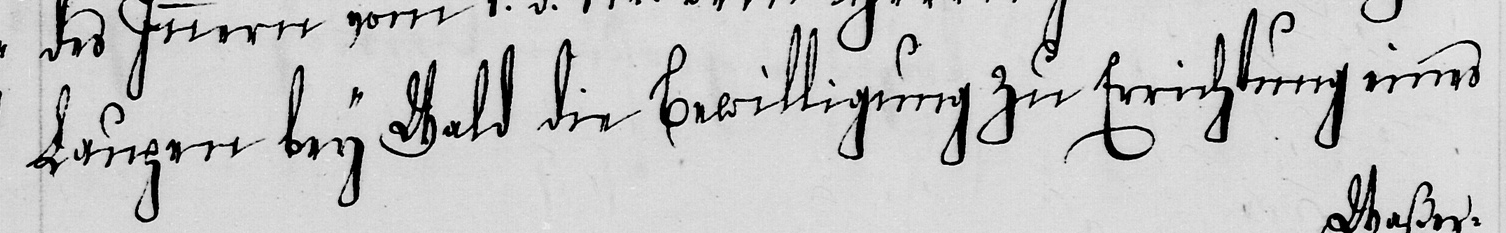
Laupen bey Wald die Bewilligung zu Errichtung eines
